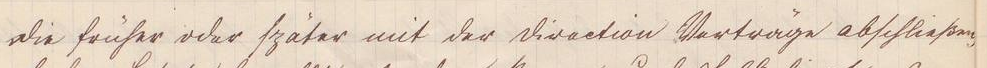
die früher oder später mit der Direction Verträge abschließen,
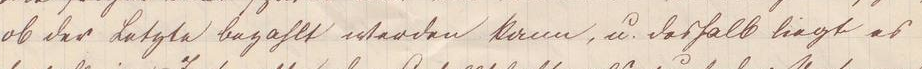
ob der Letzte bezahlt werden kann, u. deshalb liegt es
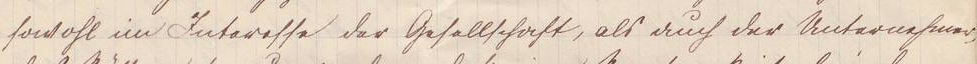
sowohl im Interesse der Gesellschaft, als auch der Unternehmer
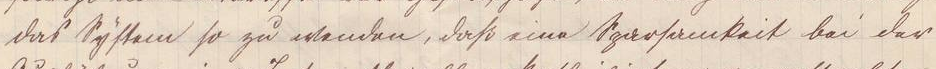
das System so zu werden, daß eine Sparsamkeit bei der
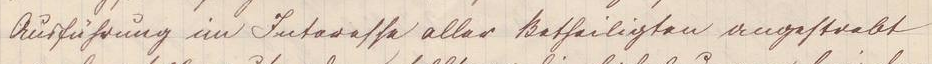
Ausführung im Interesse aller Betheiligten angestrebt
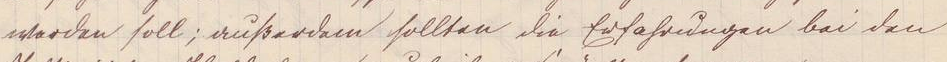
werden soll; außerdem sollten die Erfahrungen bei den
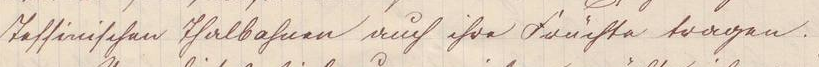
Tessinischen Thalbahnen auch ihre Früchte tragen.
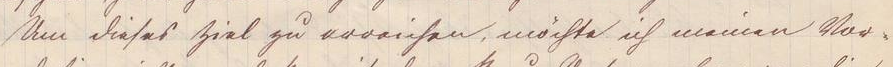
Um dieses Ziel zu erreichen, möchte ich meinen Vor-
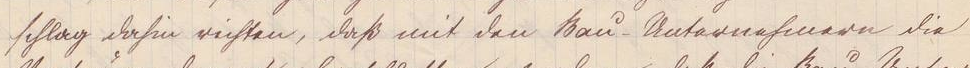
schlag dahin richten, daß mit den Bau-Unternehmern die
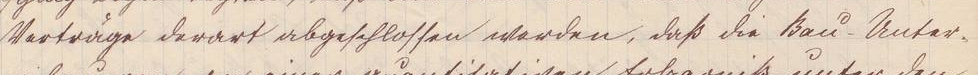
Verträge derart abgeschlossen werden, daß die Bau-Unter-
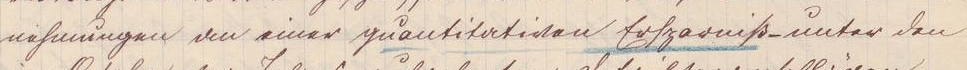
nehmungen an einer quantitativen Ersparniß – unter den
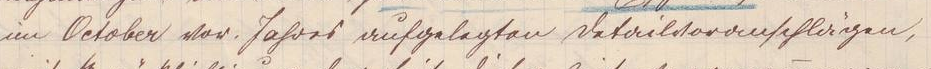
im October vor. Jahres aufgelegten Detailvoranschlägen,
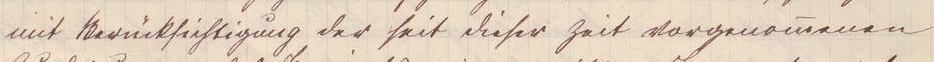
mit Berücksichtigung der seit dieser Zeit vorgenommenen
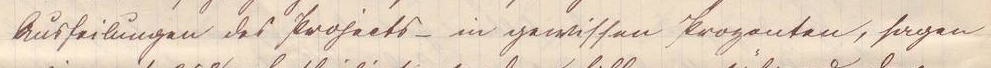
Ausfeilungen des Projects – in gewissen Prozenten, sagen
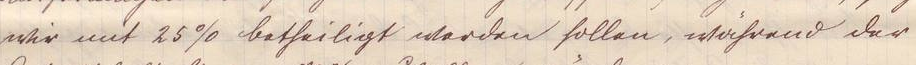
wir mit 25% betheiligt werden sollen, während der
